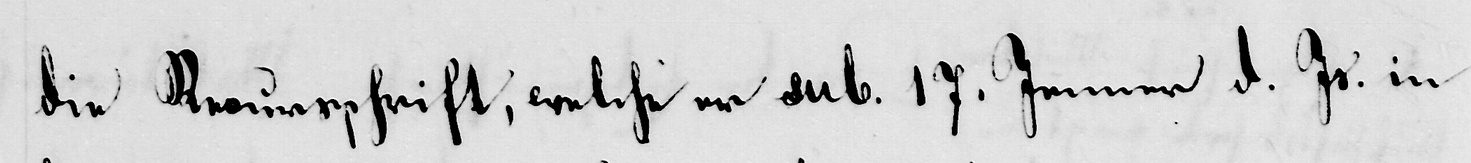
die Recursschrift, welche er sub. 17. Januar d. Js. in
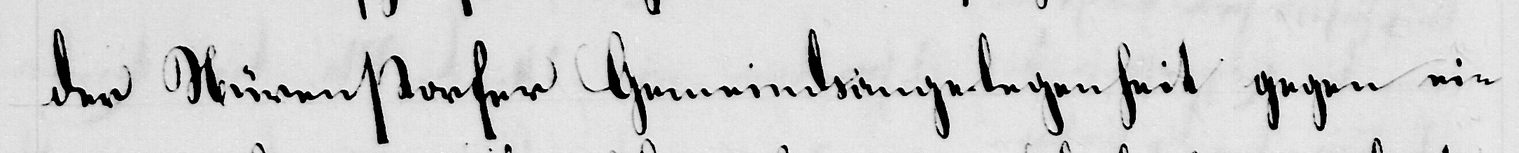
der Nürenstorfer Gemeindsangelegenheit gegen ei¬
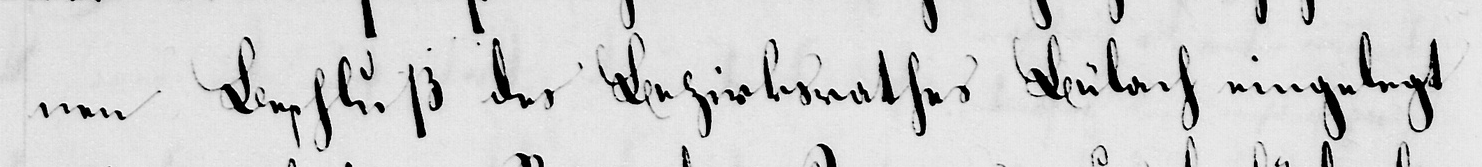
nen Beschluß des Bezirksrathes Bülach eingelegt
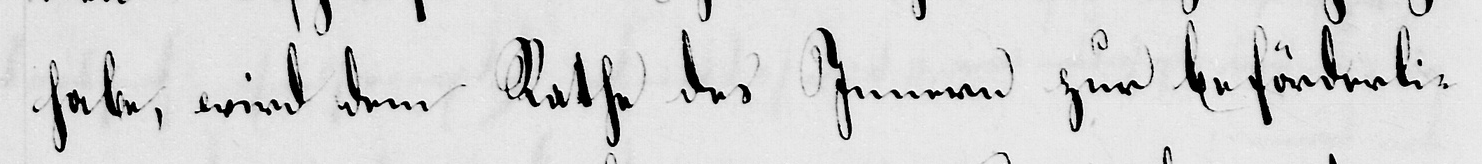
habe, wird dem Rathe des Innern zur beförderli¬
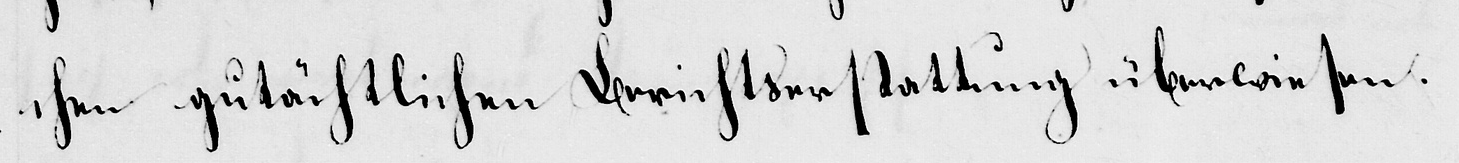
chen gutächtlichen Berichtserstattung überwiesen.
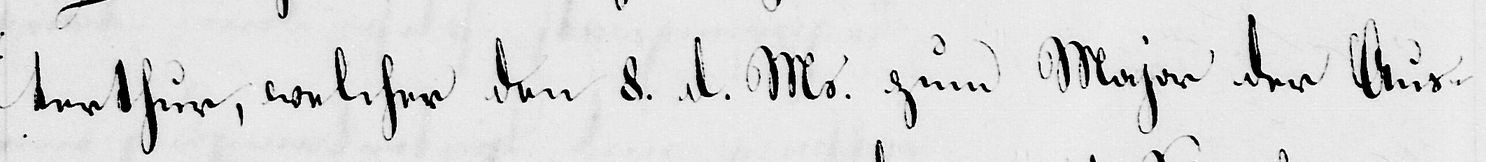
terthur, welcher den 8. d. Ms. zum Major der Aus¬
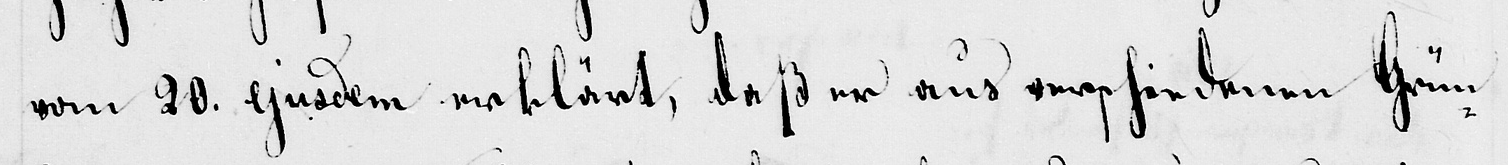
vom 20. ejusdem erklärt, daβ er aus verschiedenen Grün¬
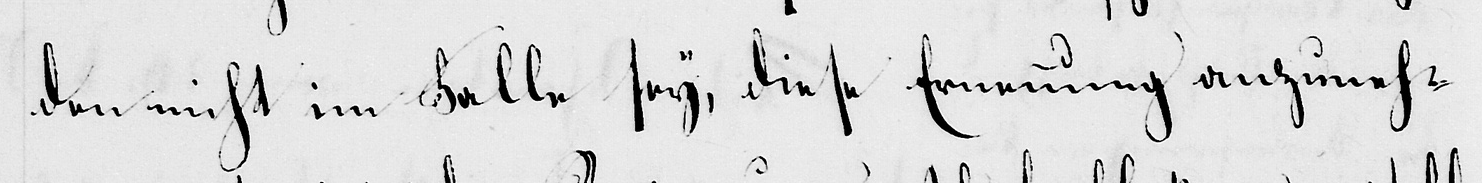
den nicht im Falle sey, diese Ernennung anzuneh¬
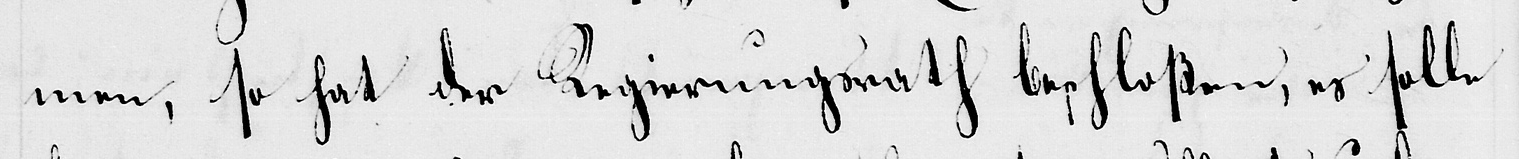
men, so hat der Regierungsrath beschloβen, es solle
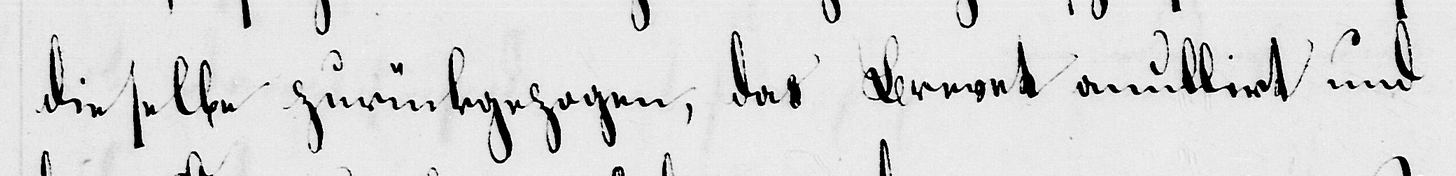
dieselbe zurückgezogen, das Brevet anullirt und
